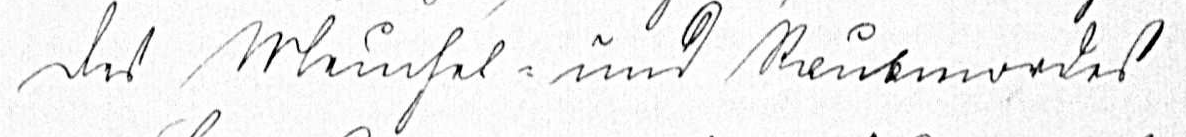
des Meuchel- und Raubmordes
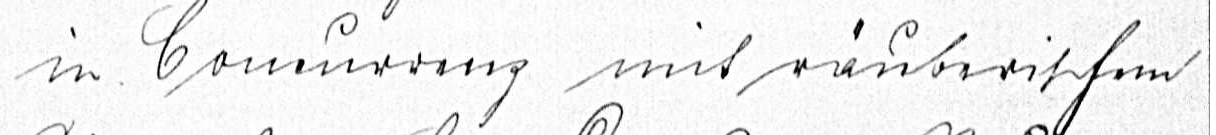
in Concurrenz mit räuberischem
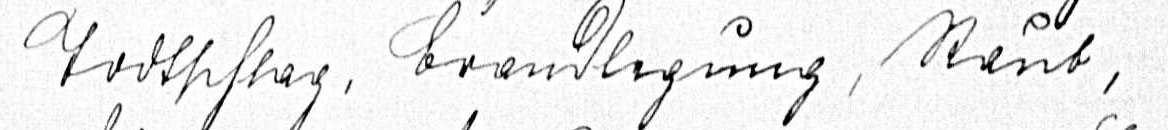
Todtschlag, Brandlegung, Raub,
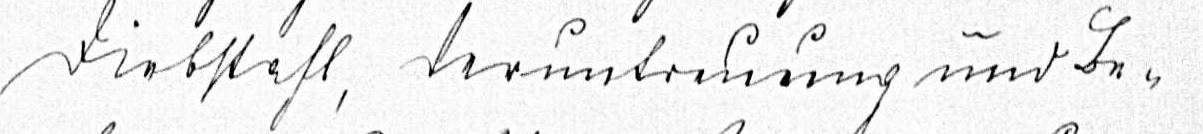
Diebstahl, Deruntreuung und Be¬
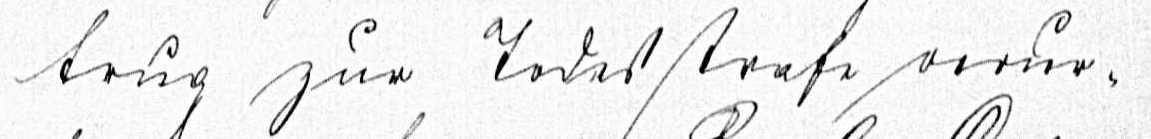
trug zur Todesstrafe verur¬
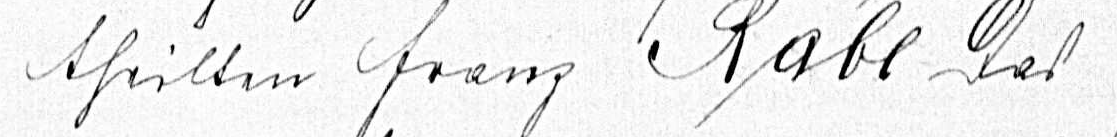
theilten Franz Rabl das
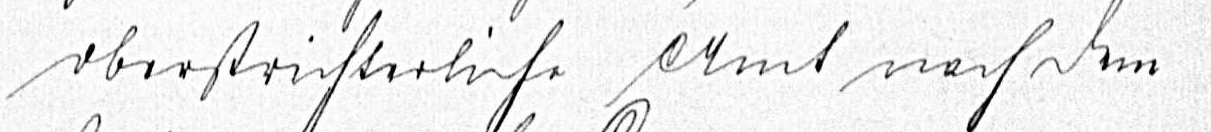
oberstrichterliche Amt nach dem
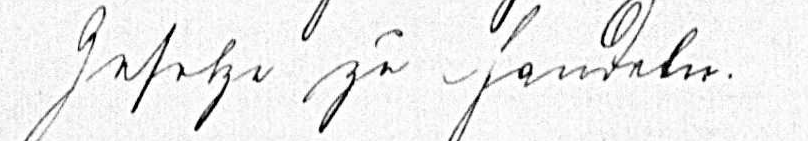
Gesetze zu handeln.
